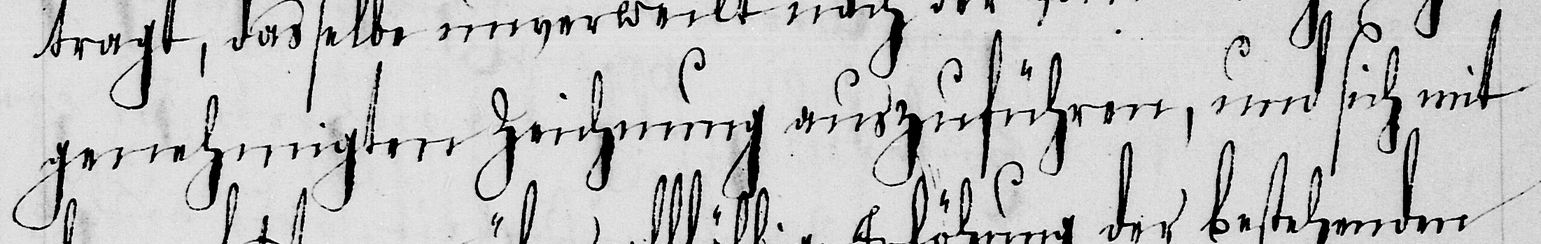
genehmigten Zeichnung auszuführen, und sich mit
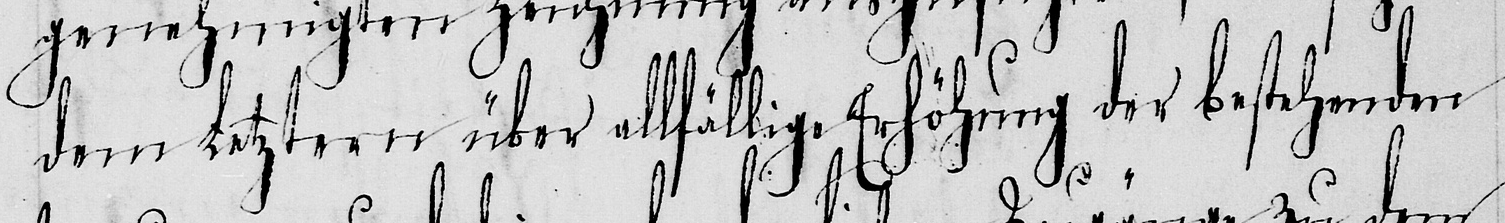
dem Letztern über allfällige Erhöhung der bestehen¬
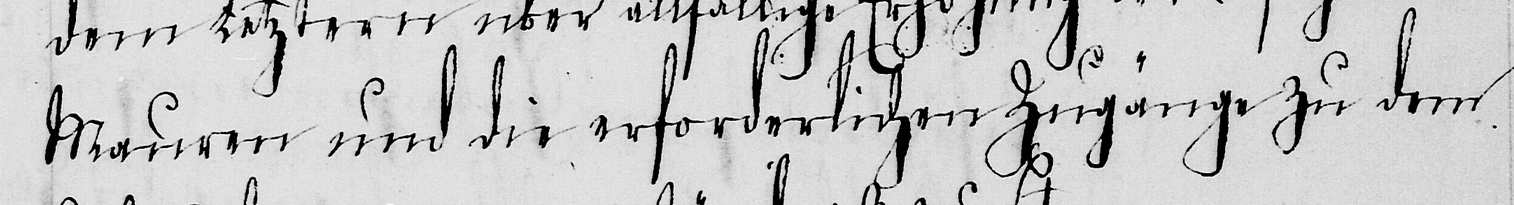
Mauern und die erforderlichen Zugänge zu dem
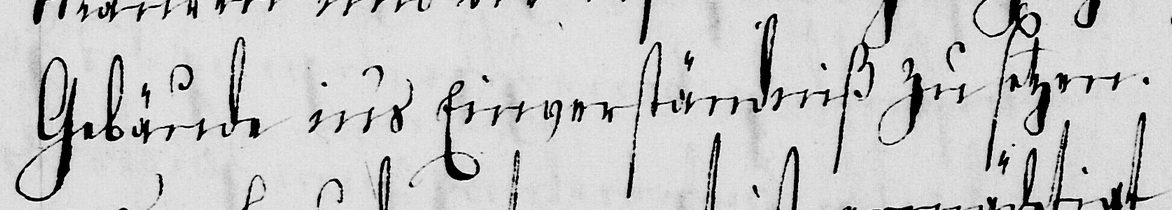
Gebäude ins Einverständniß zu setzen.
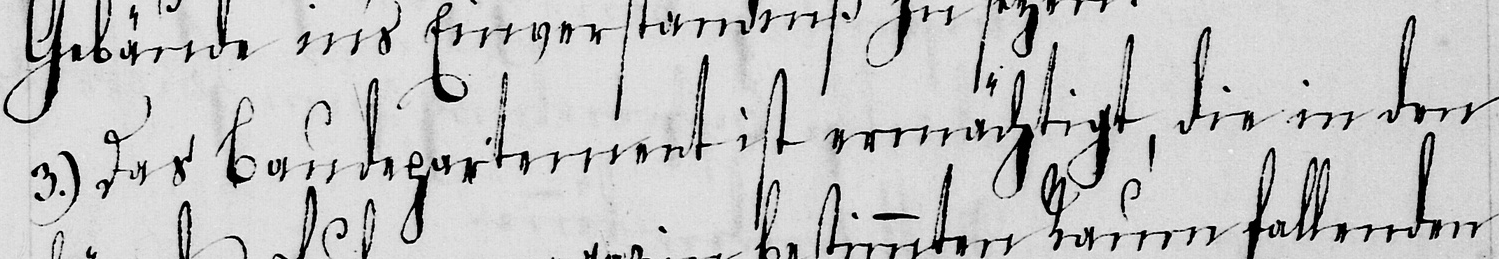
3.) Das Baudepartement ist ermächtigt, die in den
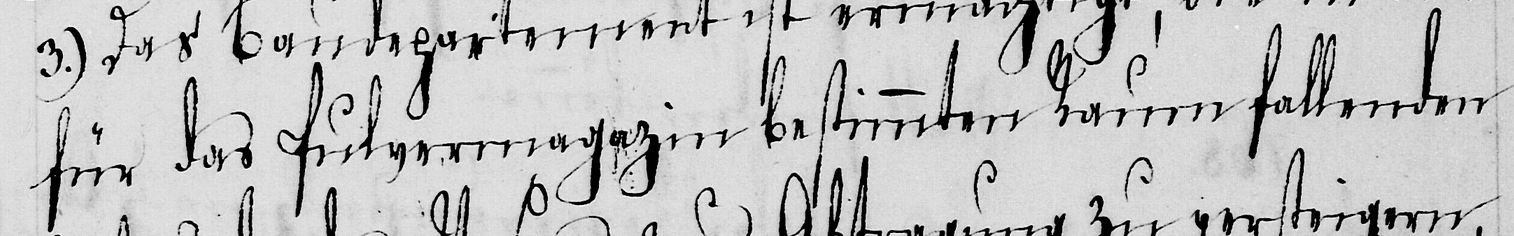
für das Pulvermagazin bestimmten Raum fallenden
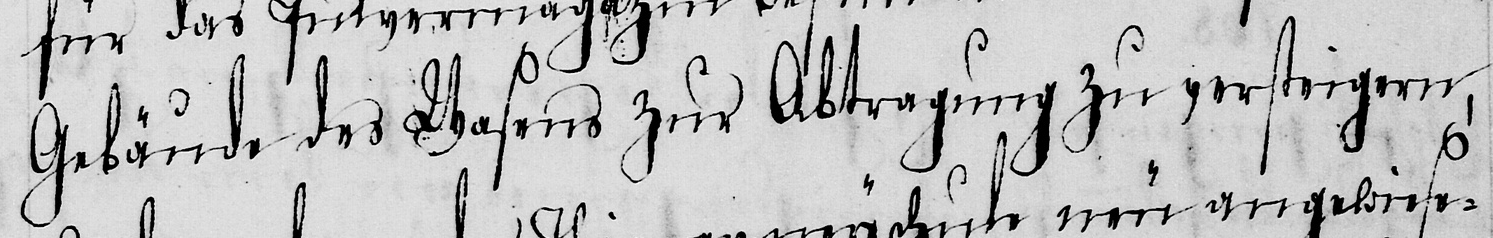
Gebäude des Wasens zur Abtragung zu versteigern,
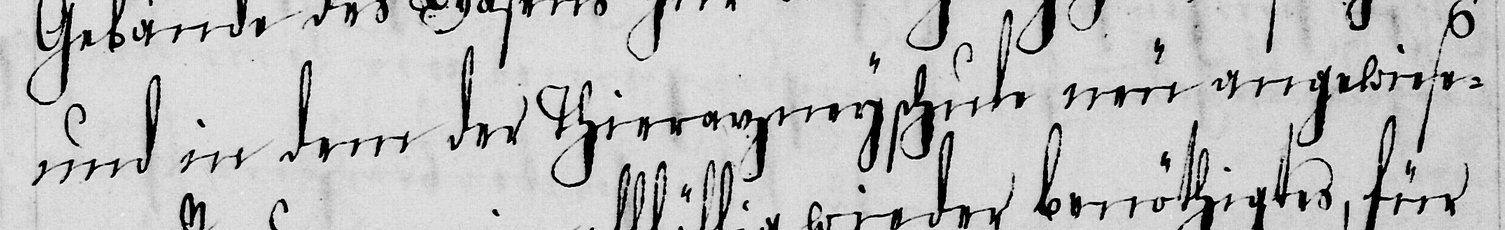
und in dem der Thierarzneyschule neu angewiese¬
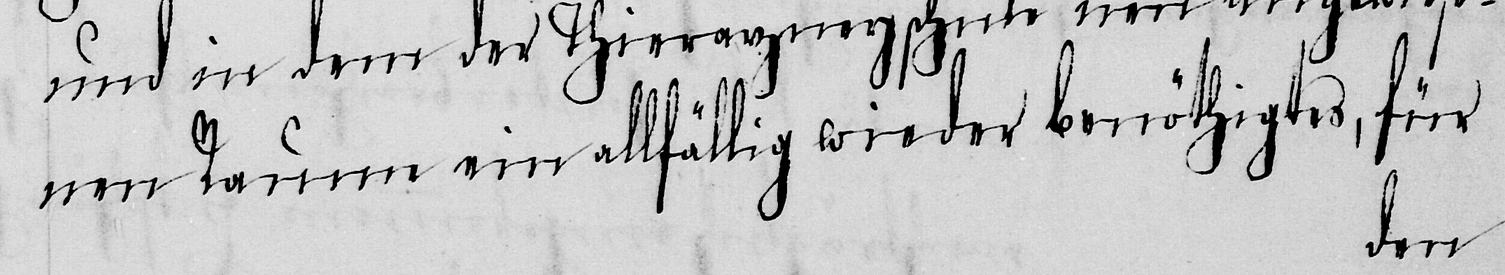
nen Raume ein allfällig wieder benöthigtes, für
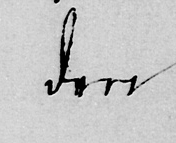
den
